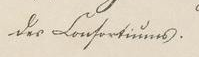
des Consortiums.
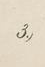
3.)
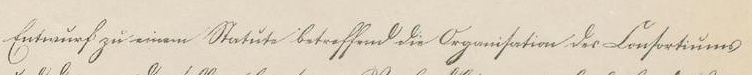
Entwurf zu einem Statute betreffend die Organisation des Consortiums
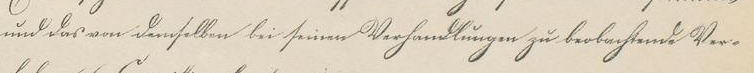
und das von demselben bei seinen Verhandlungen zu beobachtende Ver-
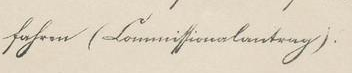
fahren (Commissionalantrag).
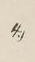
4.)
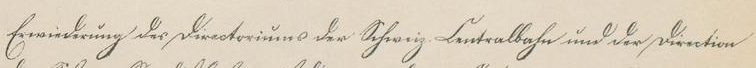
Erwiederung des Directoriums der Schweiz. Centralbahn und der Direction
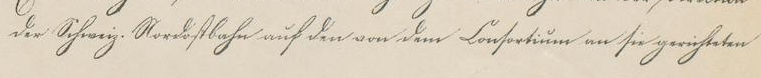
der Schweiz. Nordostbahn auf den von dem Consortium an sie gerichteten
